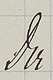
Der
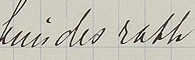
Bundesrath
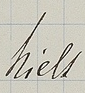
hielt
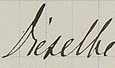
Dieselbe
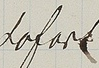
sofort
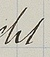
Angel.
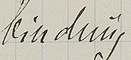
bindung
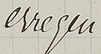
Aufsehen
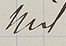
nicht
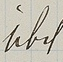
der
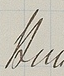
mir
